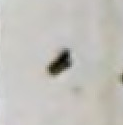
„
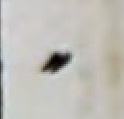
„
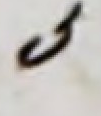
5
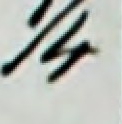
1/4
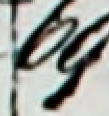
69
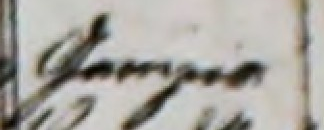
Gamzie
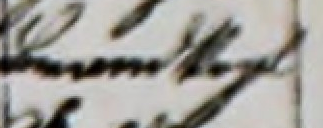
Brandkogl
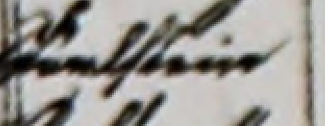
Fürstein
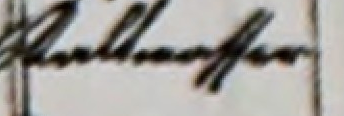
Kaltmesser
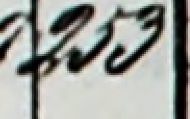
253
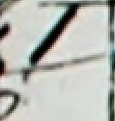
I
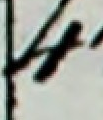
4
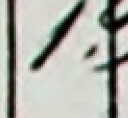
1
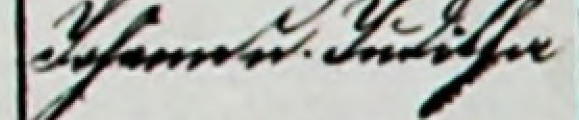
Johann u. Juditha
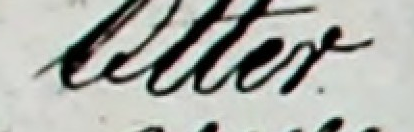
Otter
